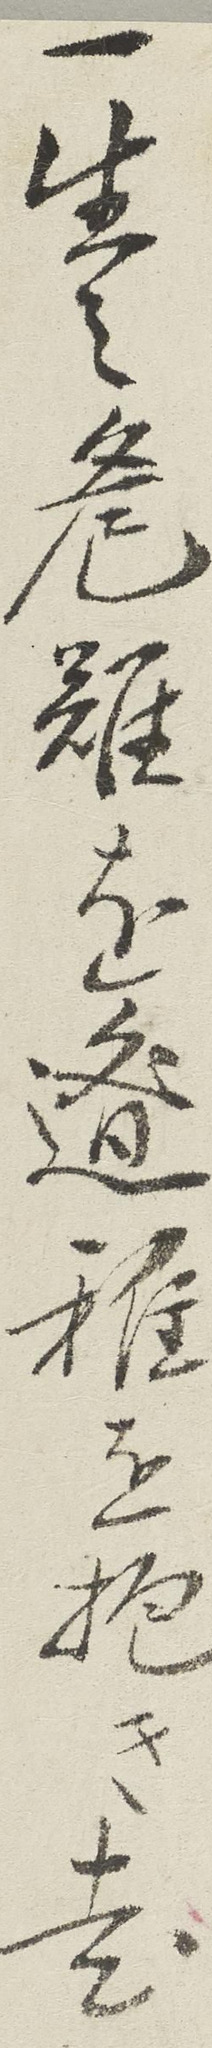一生之危難を遁稚を抱き老
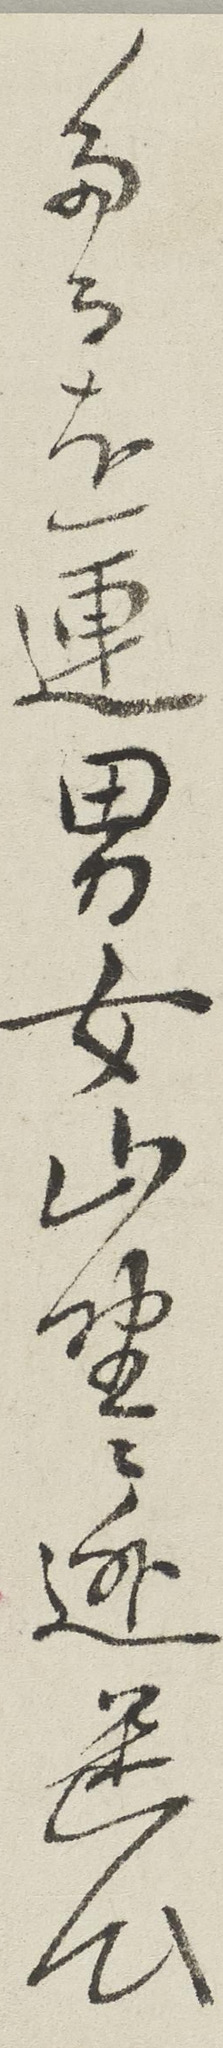たるを連男女山野ニ逃迷ひ
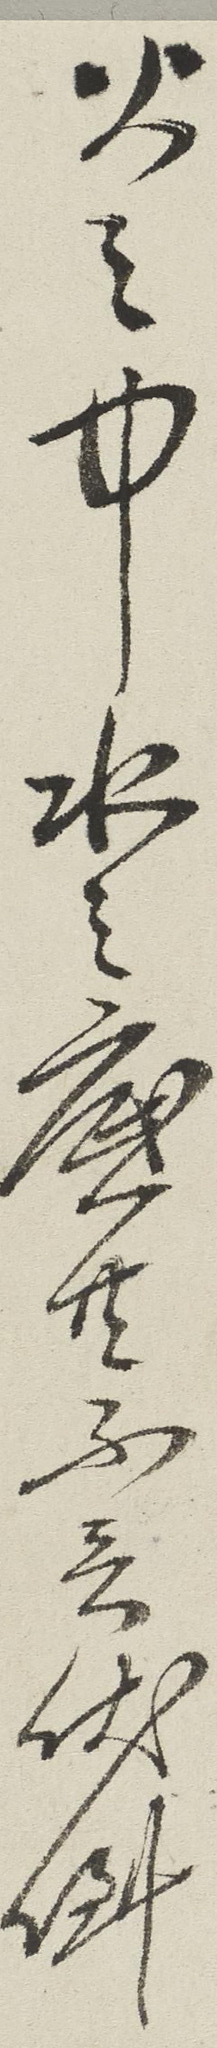火之中水之底共不言伏倒
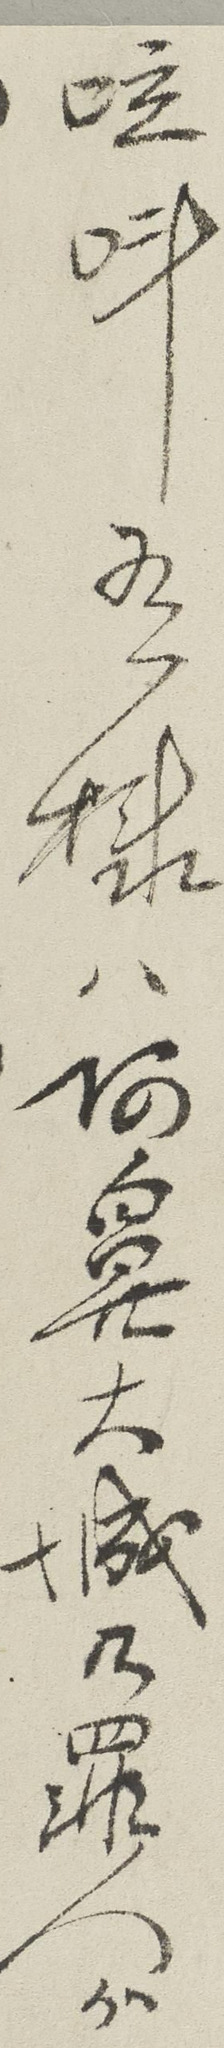泣叫有様は阿鼻大城の罪人が
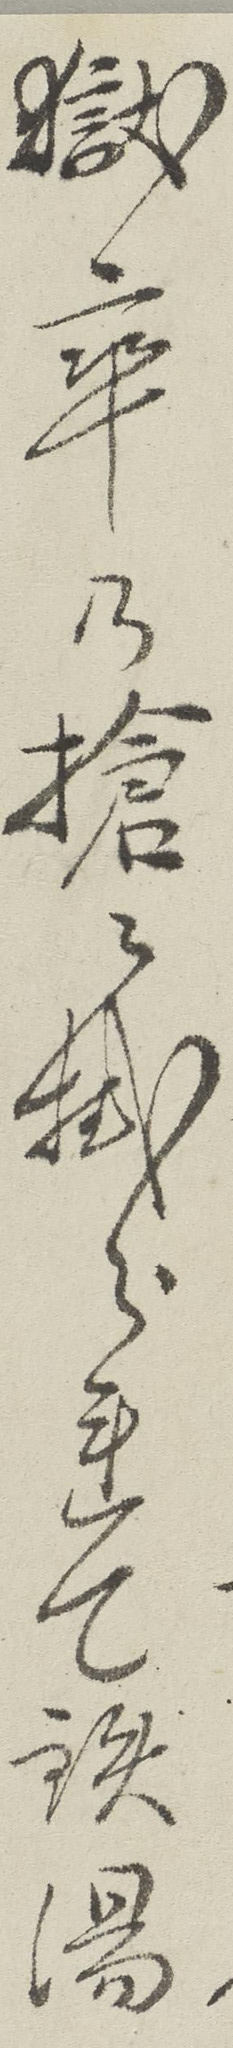獄卒の槍ニ掛られて鉄湯

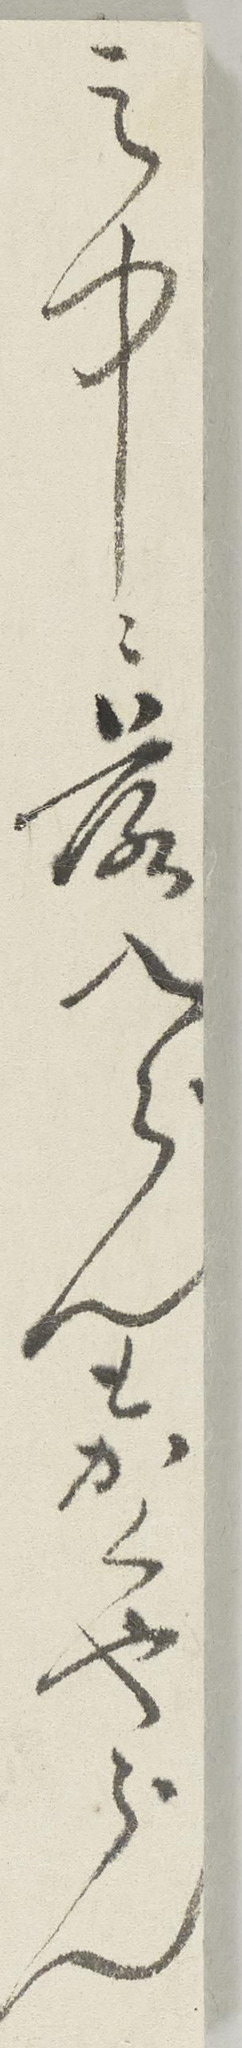之中ニ落入らんもかくやらん
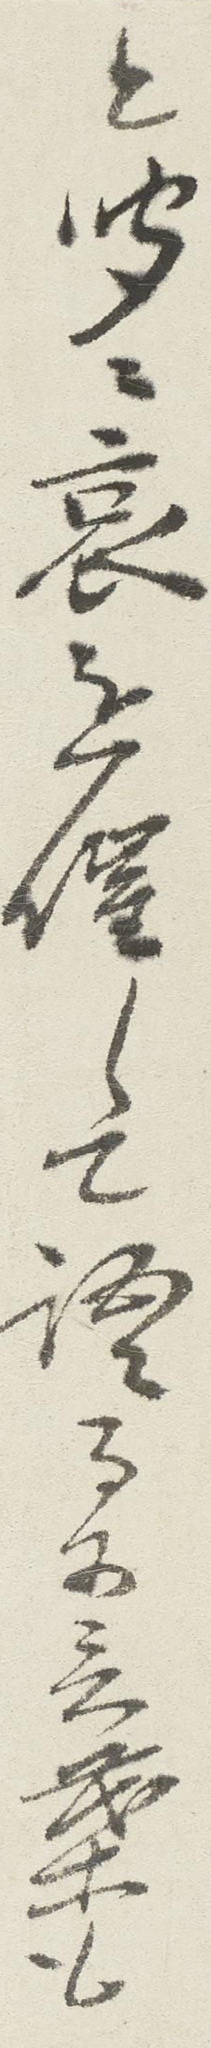と聞ニ哀を催して語るに言葉も
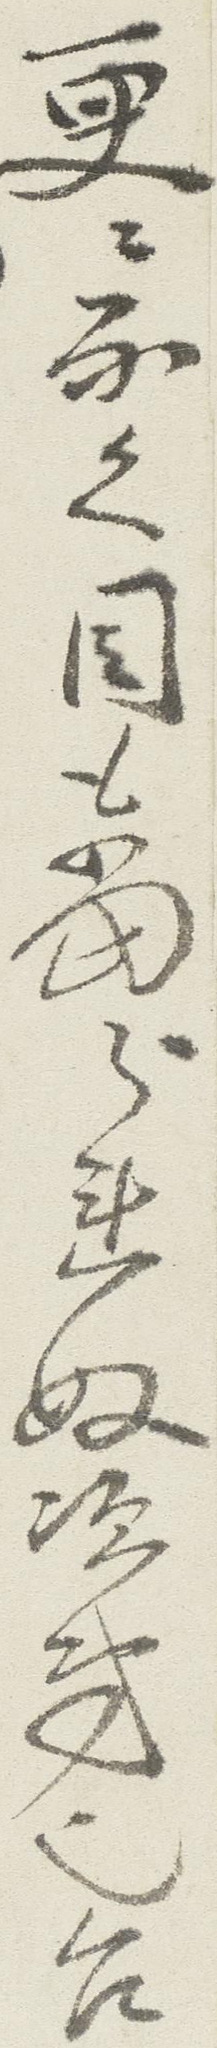更ニなく目も当られぬ次第也乍
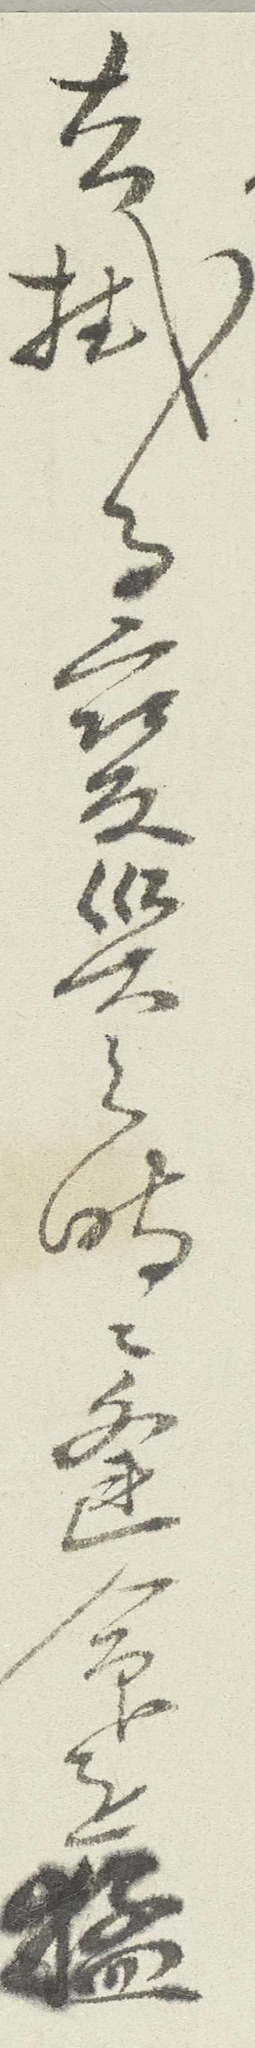左掛る変災之時ニ逢命を猛
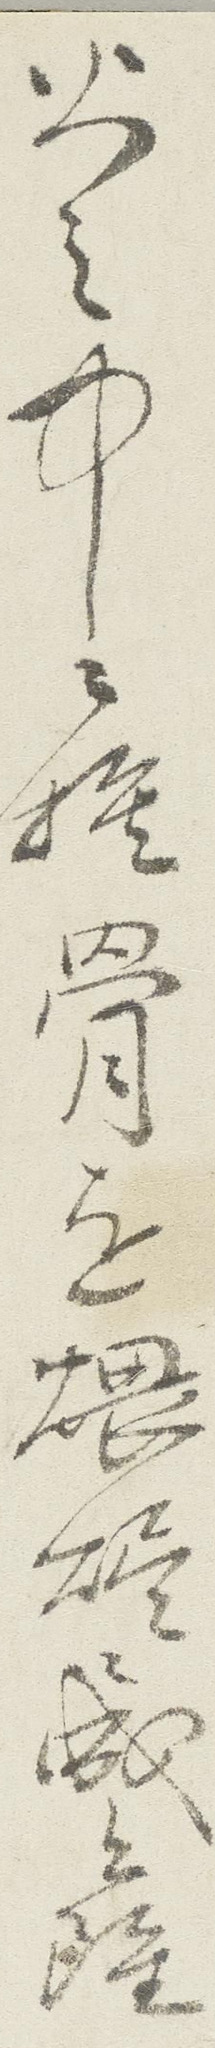火之中ニ捨骨を煨燼ニ成と雖
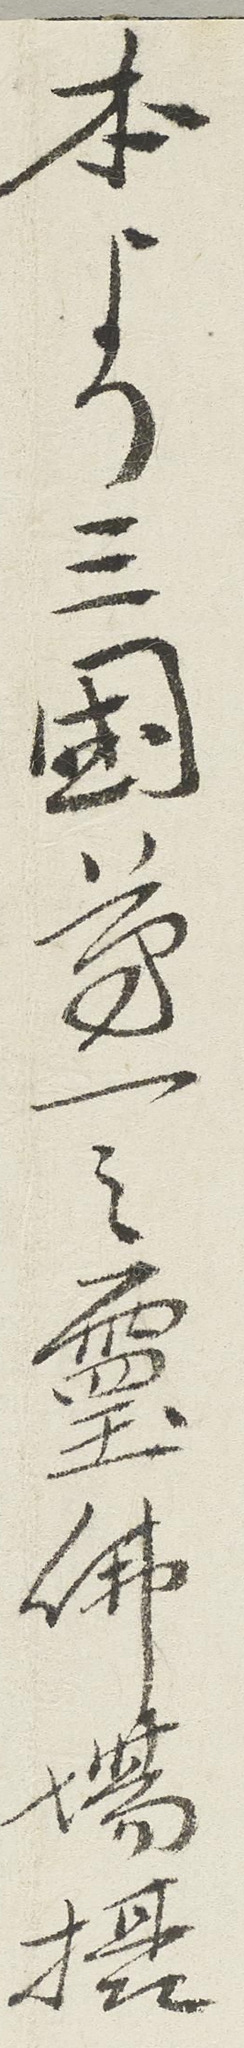本より三国第一之霊仏場摂
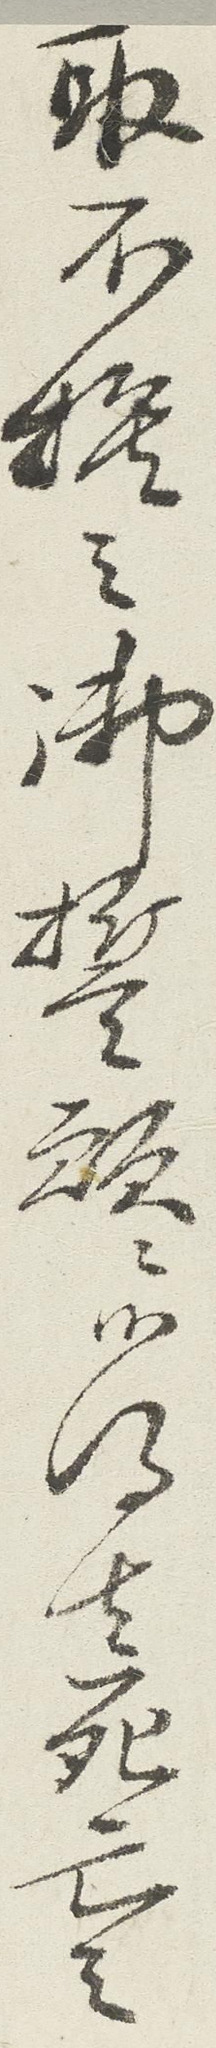取不捨之御誓願ニ候得者死亡之
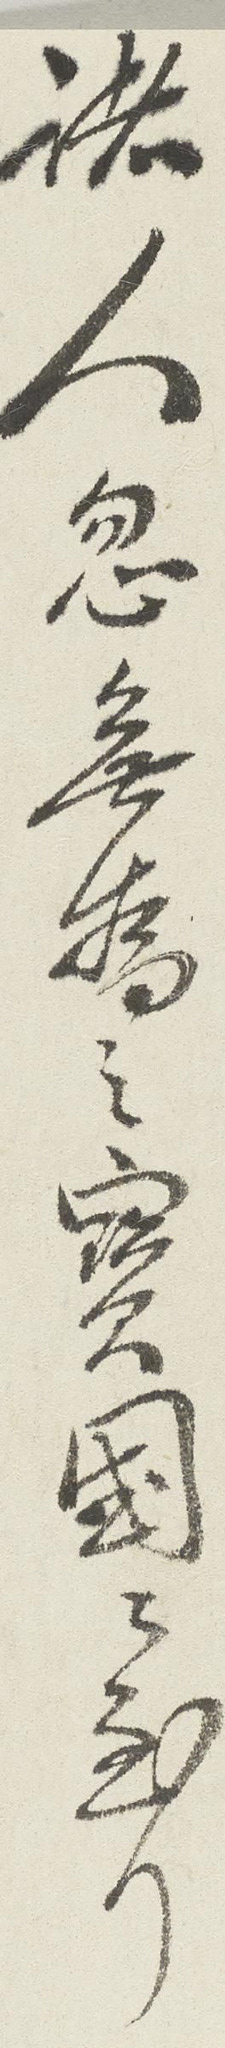諸人忽無為之宝国ニ至り
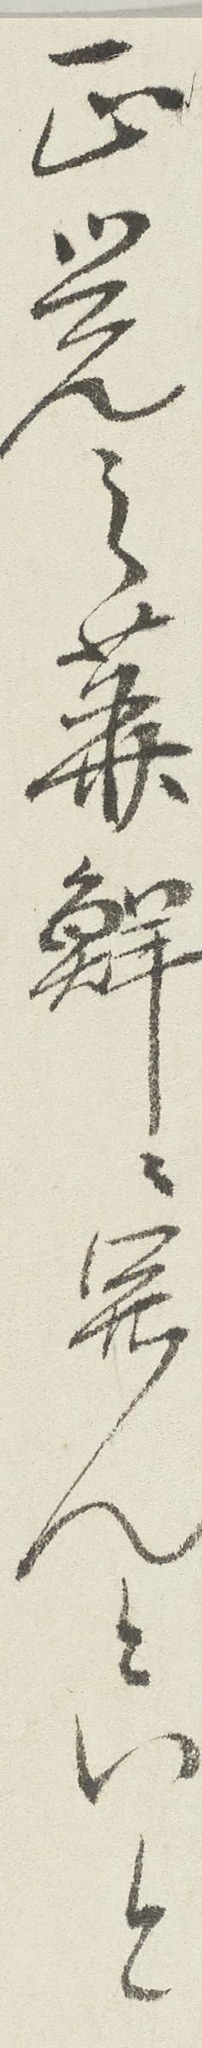正覚之華鮮ニ開んといと
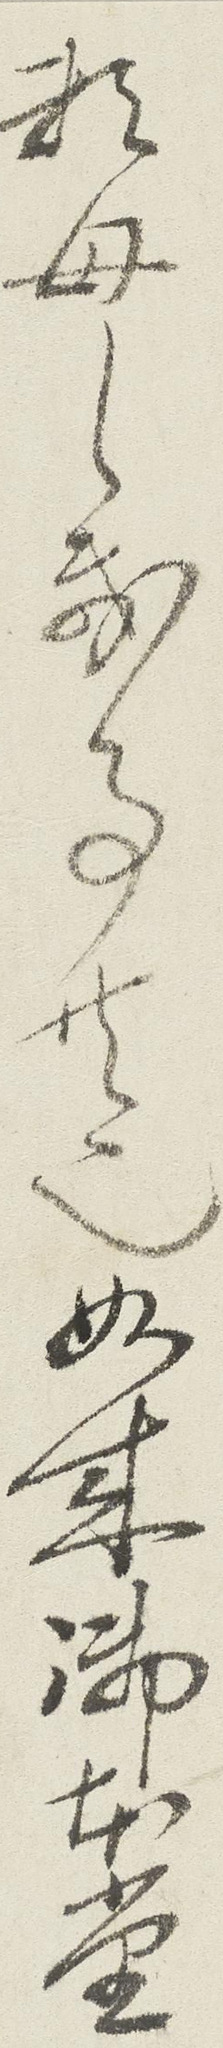頼もしき事共也如来御本堂
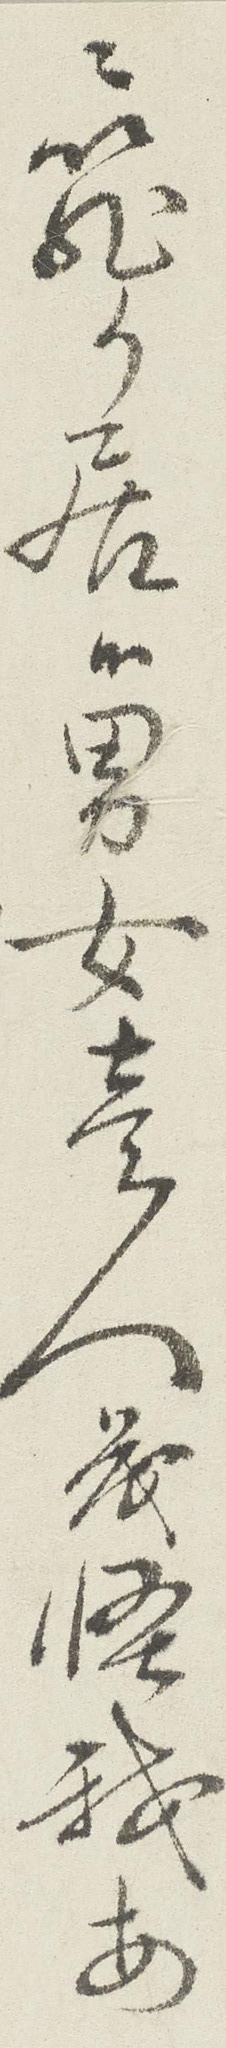ニ籠り居候男女壱人も怪我あ
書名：[善光寺地震に関する書状]
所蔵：東京大学地震研究所図書室 Earthquake Research Institute Library, The University of Tokyo, JAPAN
